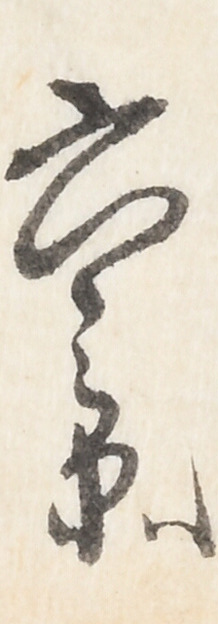茂兵衛
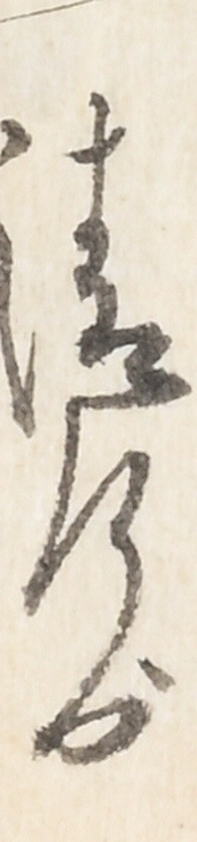清左衛門

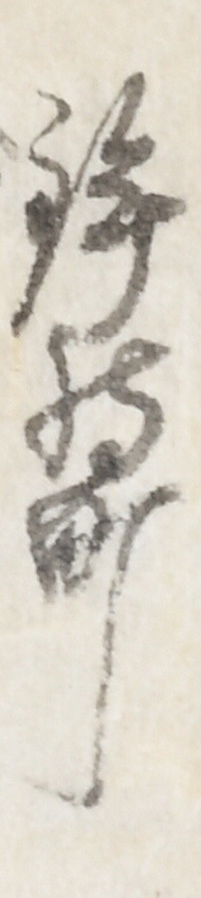鉾持町
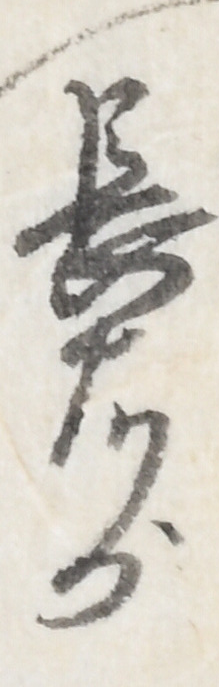平右衛門
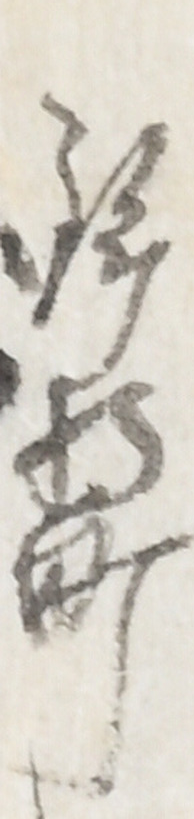鉾持町
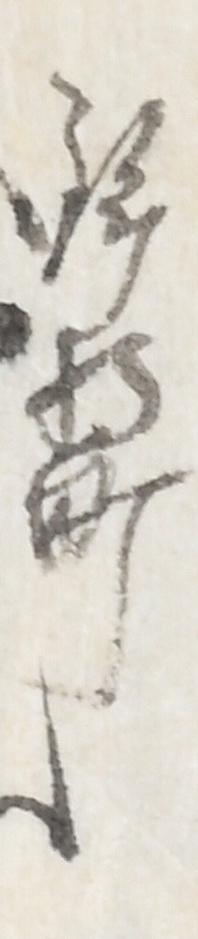鉾持町
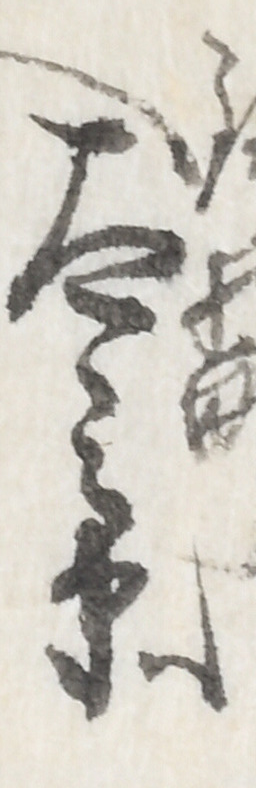久兵衛
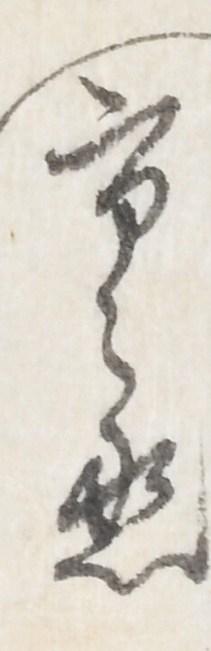市之丞
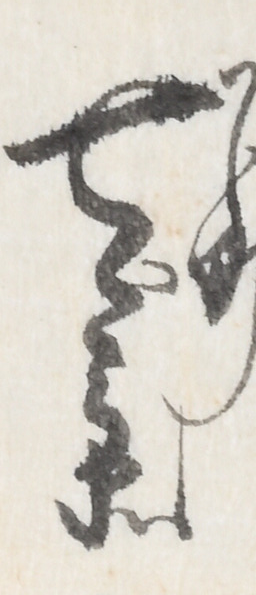久兵衛
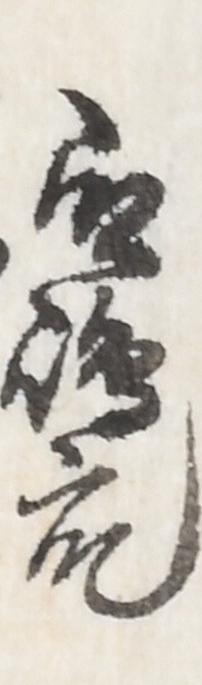取嶋衆
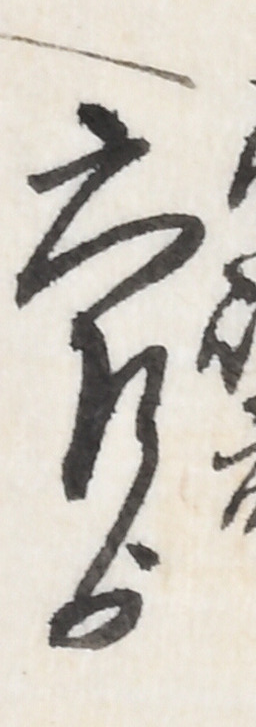六左衛門
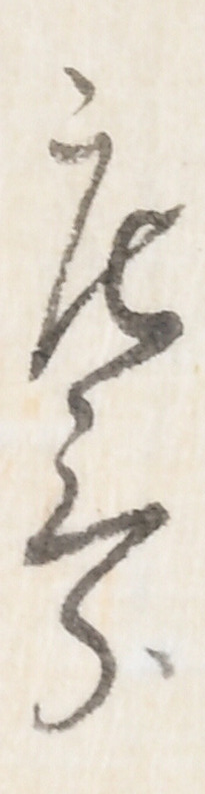庄三郎
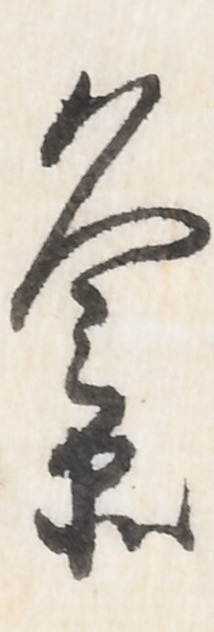久兵衛
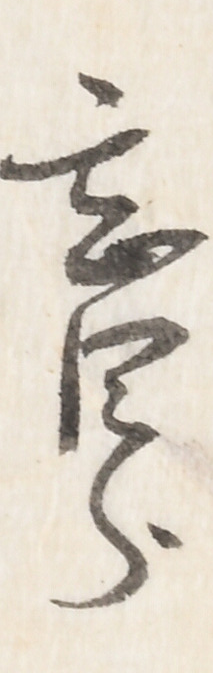伝四郎
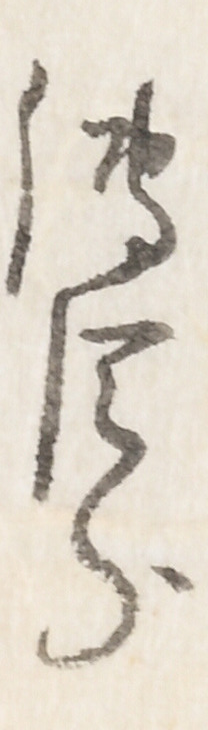伝四郎
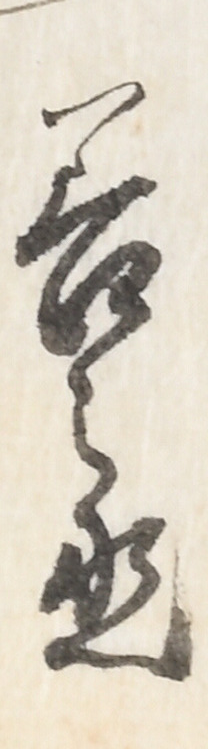善之丞
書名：合力覚帳
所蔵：伊那市立高遠町図書館・合同会社AMANE
